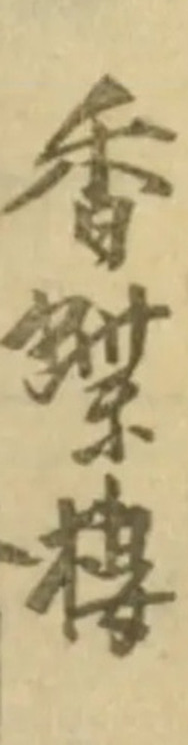香蝶楼
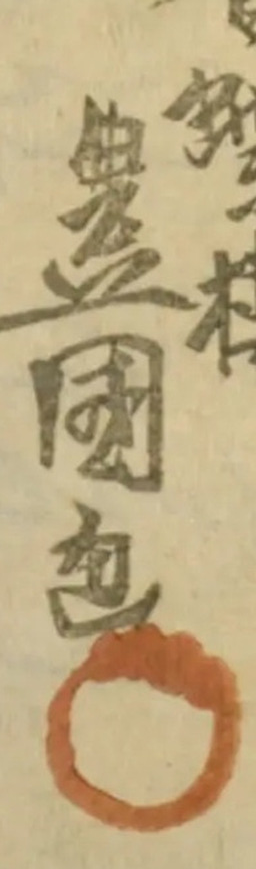豊国画
